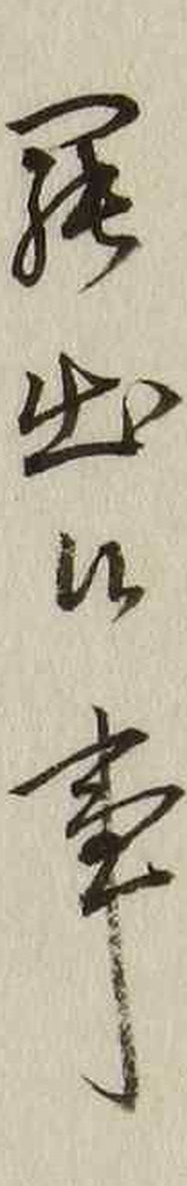罷出候事
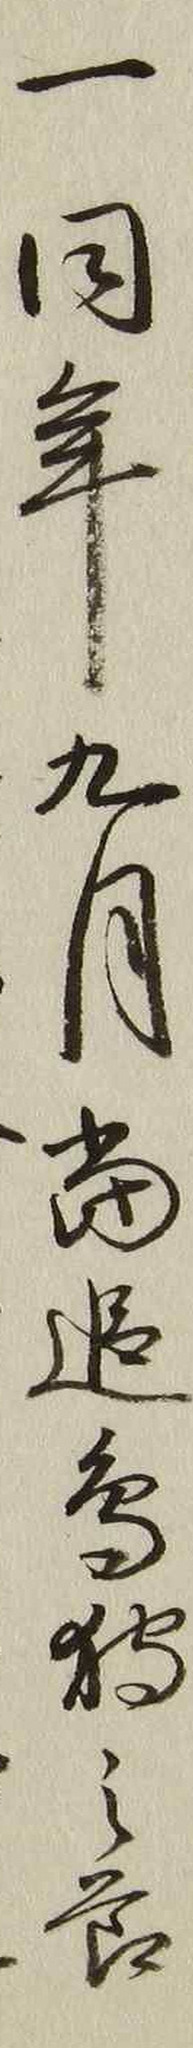一同年九月当追鳥狩之節
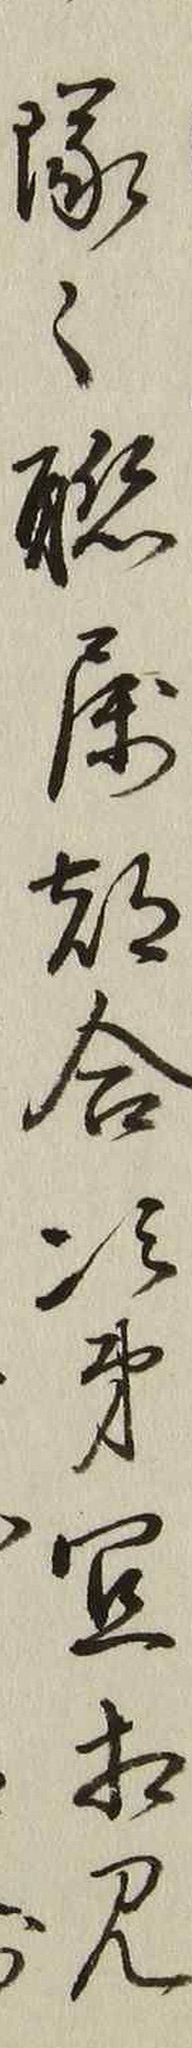隊之聯属都合次第宜相見
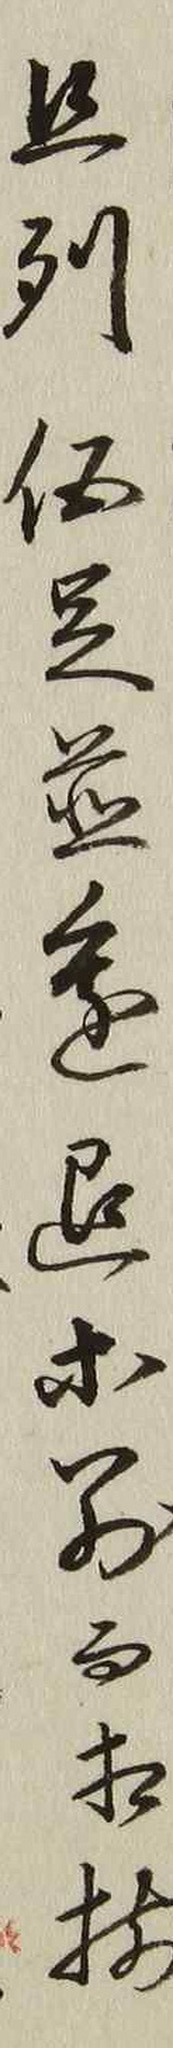且列伍足並進退等別而相揃
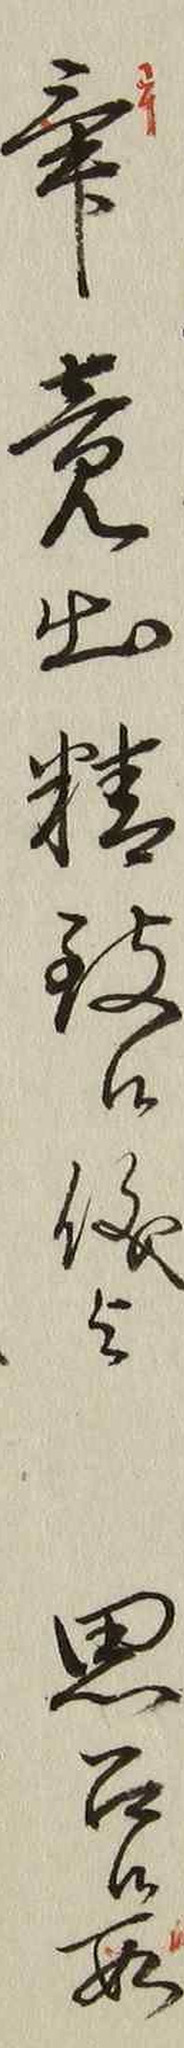畢境出精致候儀与思召候段
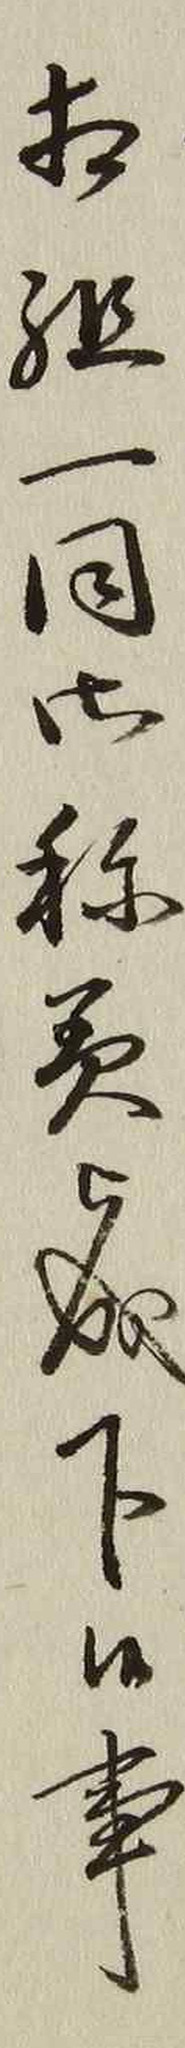相組一同御称美被成下候事
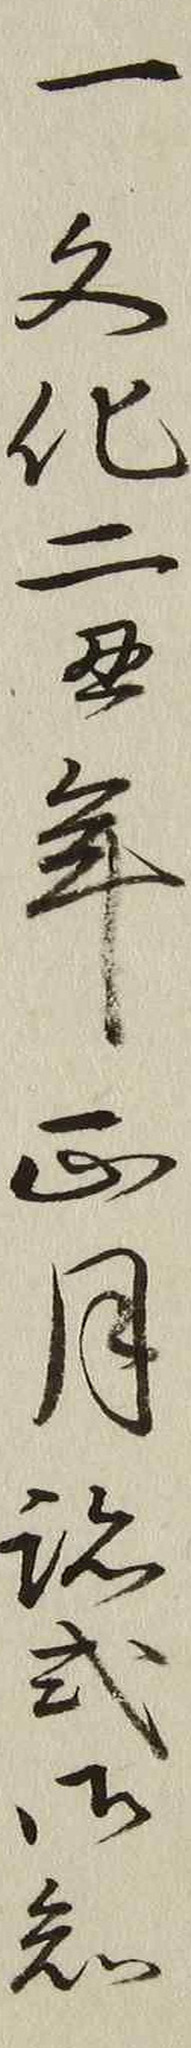一文化二丑年正月諸式御知
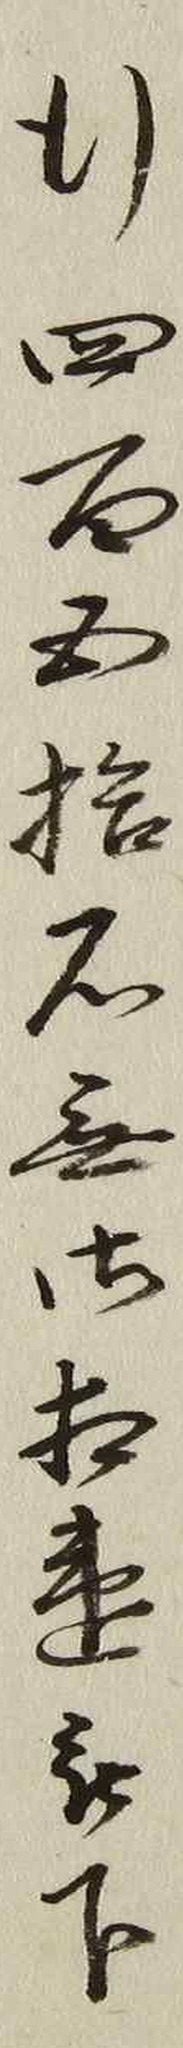行四百五拾石無御相違被下
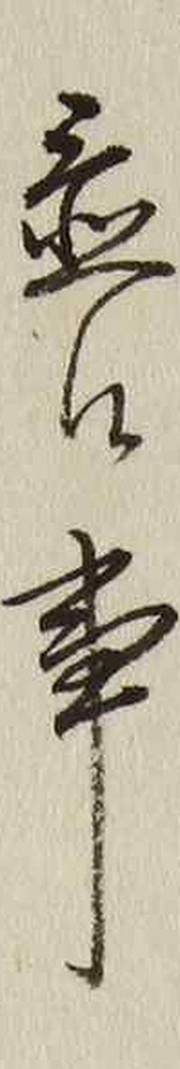置候事
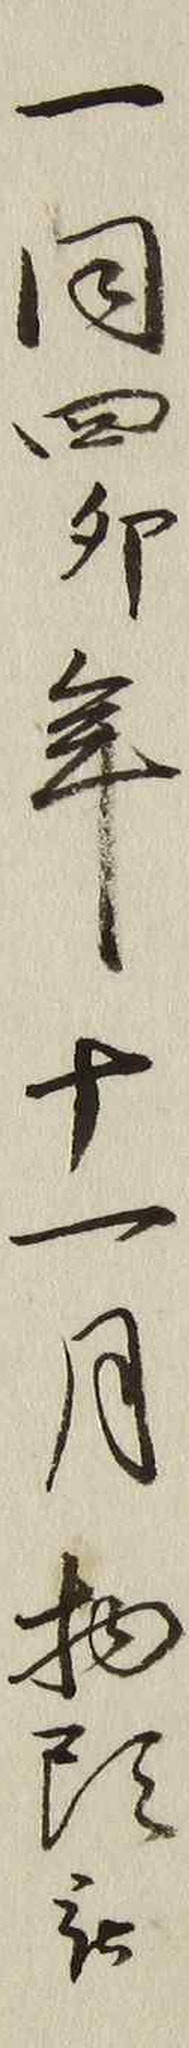一同四卯年十一月物頭被
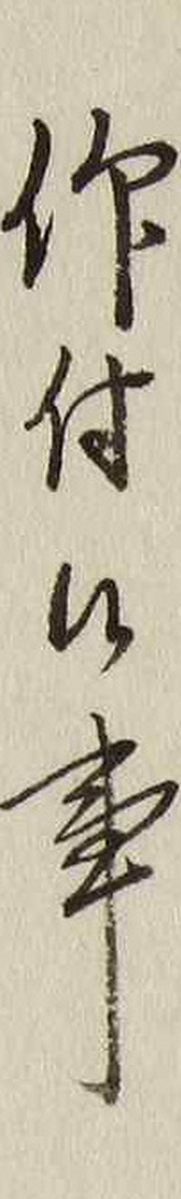仰付候事
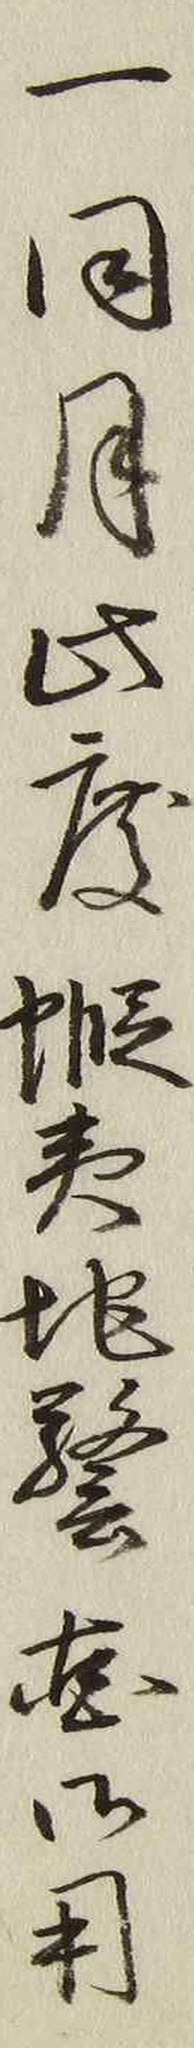一同月此度蝦夷地警固御用
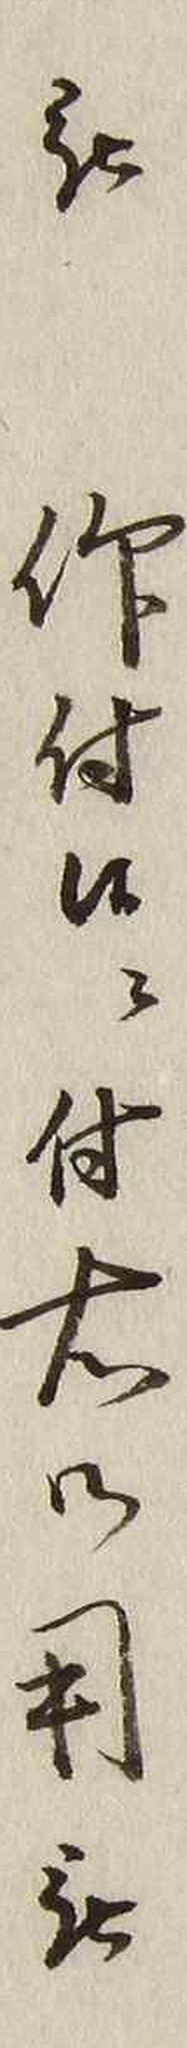被仰付候ニ付右御用被
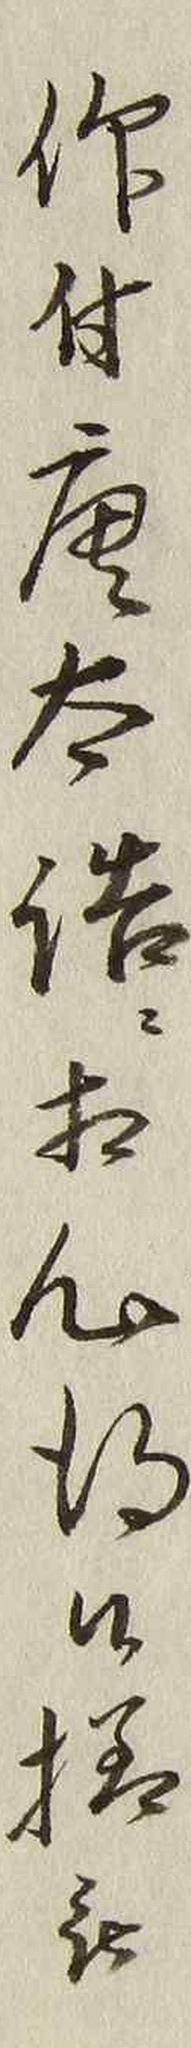仰付唐太詰ニ相心得候様被
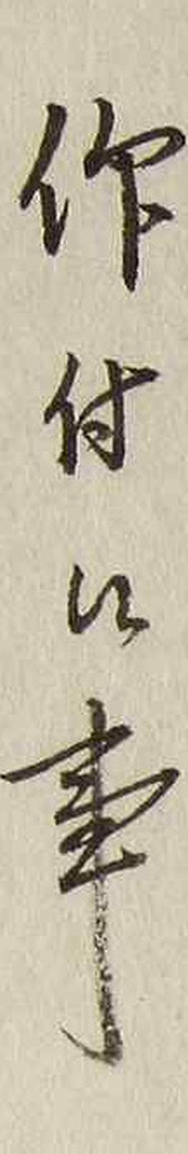仰付候事
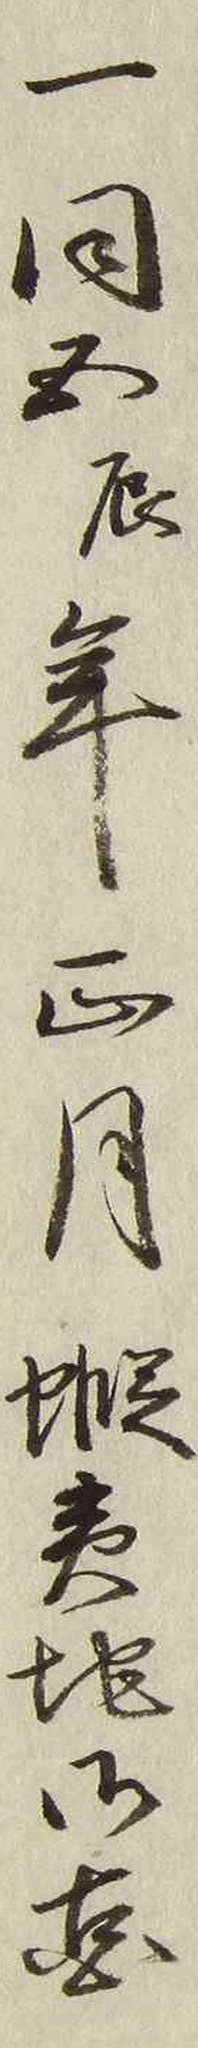一同五辰年正月蝦夷地御固
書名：諸士系譜　巻之136　た之部12
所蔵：会津若松市立会津図書館
